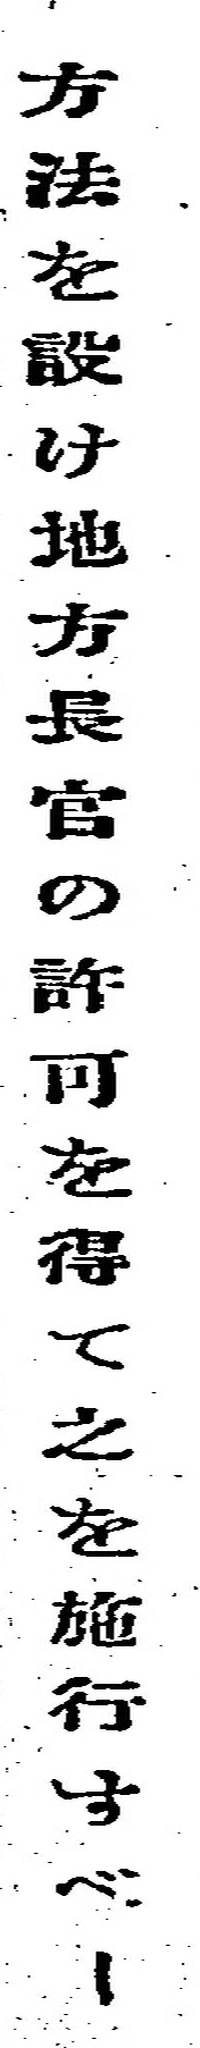方法を設け地方長官の許可を得て之を施行すべし
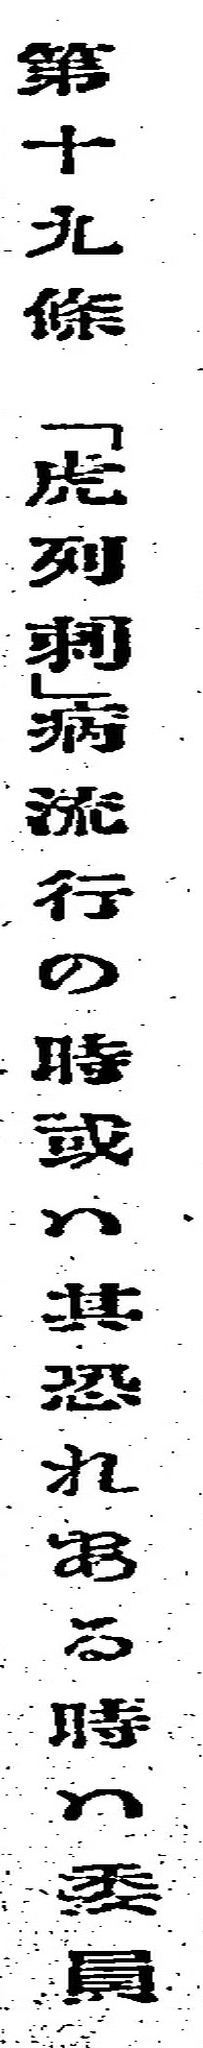第十九条「虎列刺」病流行の時或は其恐れある時は委員

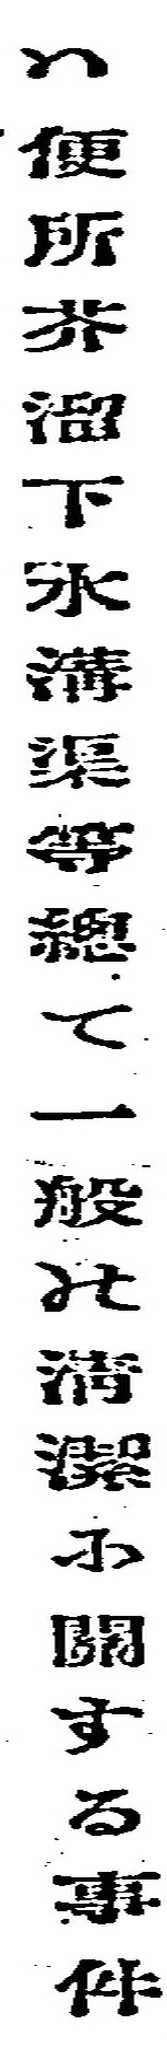は便所芥溜下水溝渠等総て一般の清潔に関する事件
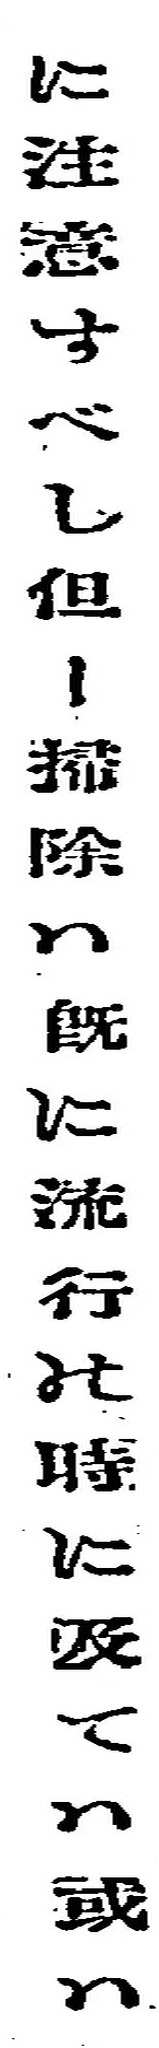に注意すべし但し掃除は既に流行の時に及ては或は
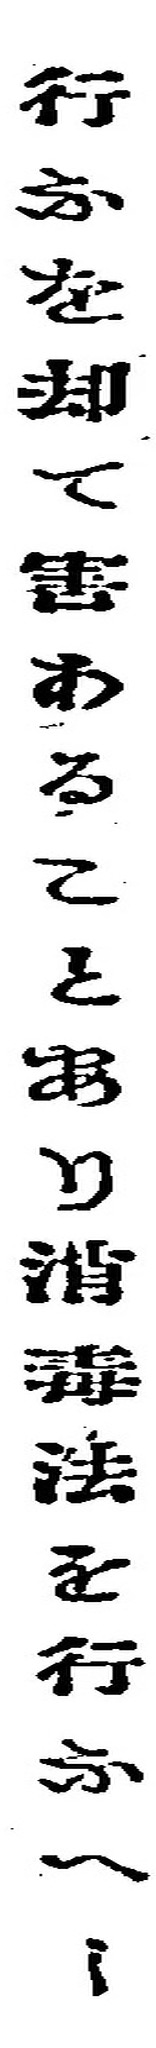行ふを却て害あることあり消毒法を行ふへし
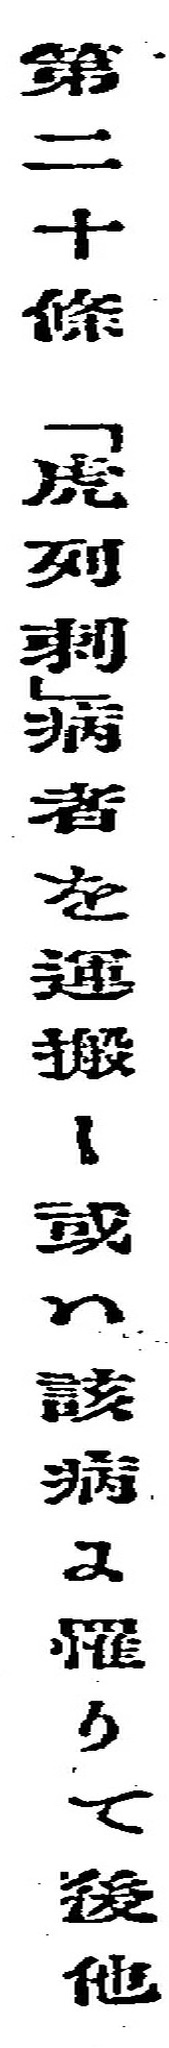第二十条「虎列刺」病者を運搬し或は該病に罹りて後他
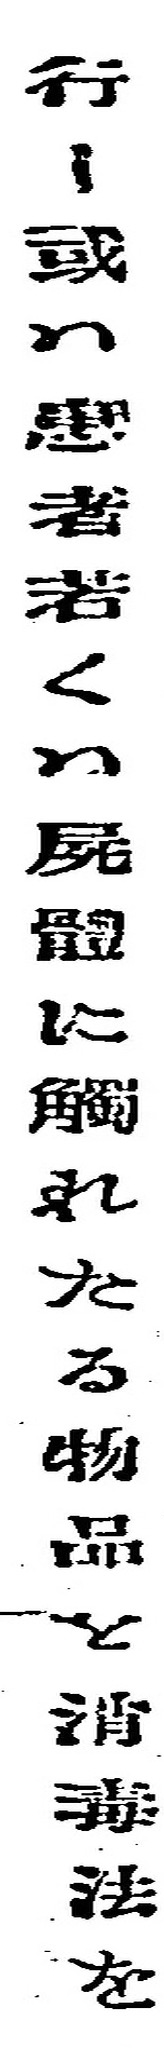行し或は患者若くは屍体に触れたる物品を消毒法を
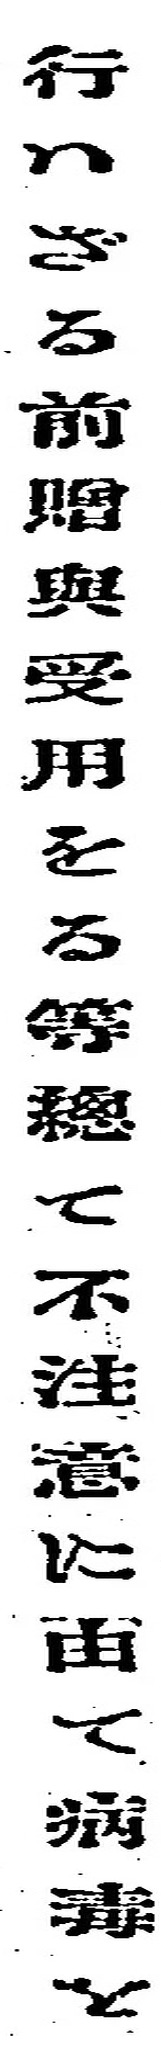行はざる前贈与受用をる等総て不注意に由て病毒を
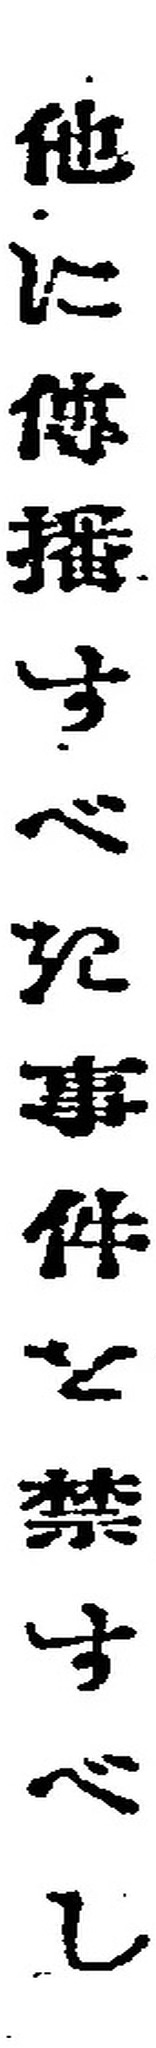他に伝播すべき事件を禁すべし
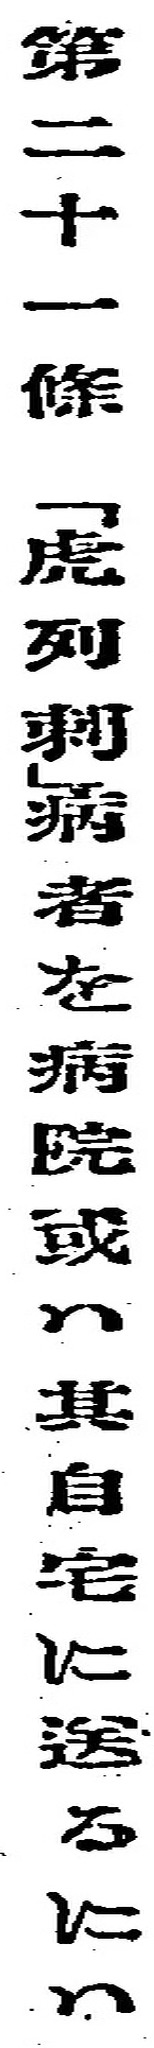第二十一条「虎列刺」病者を病院或は其自宅に送るには
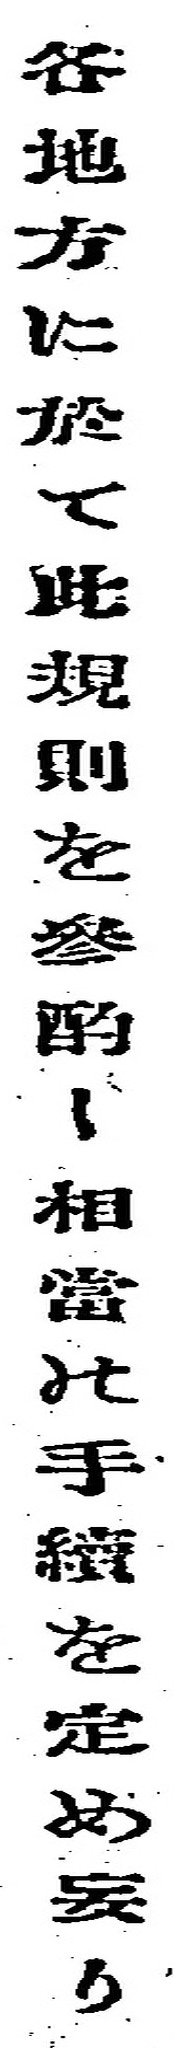各地方に於て此規則を参酌し相当の手続を定め妄り
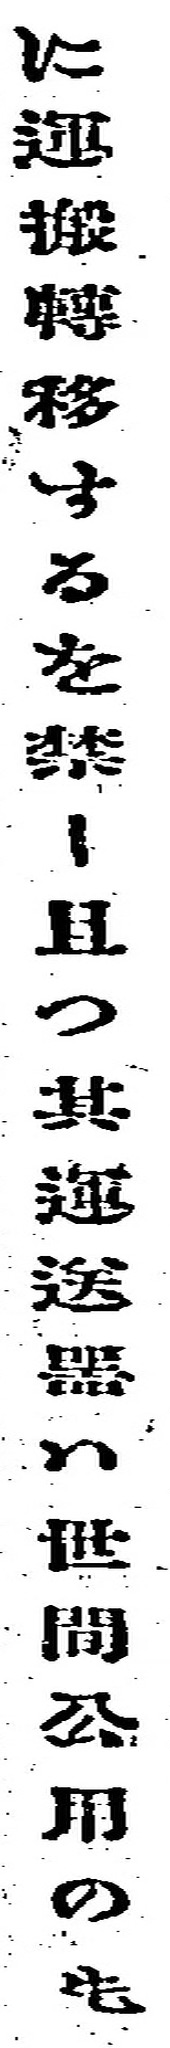に運搬転移するを禁し且つ其運送器は世間公用のも
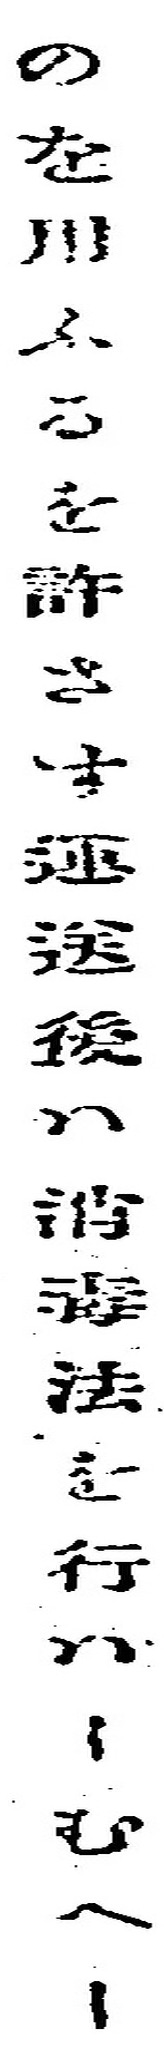のを用ふるを許さす運送後は消毒法を行はしむへし
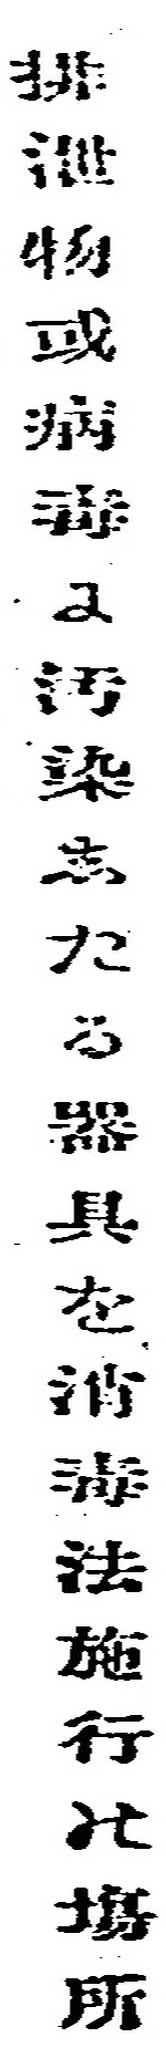排泄物或病毒に汚染したる器具を消毒法施行の場所
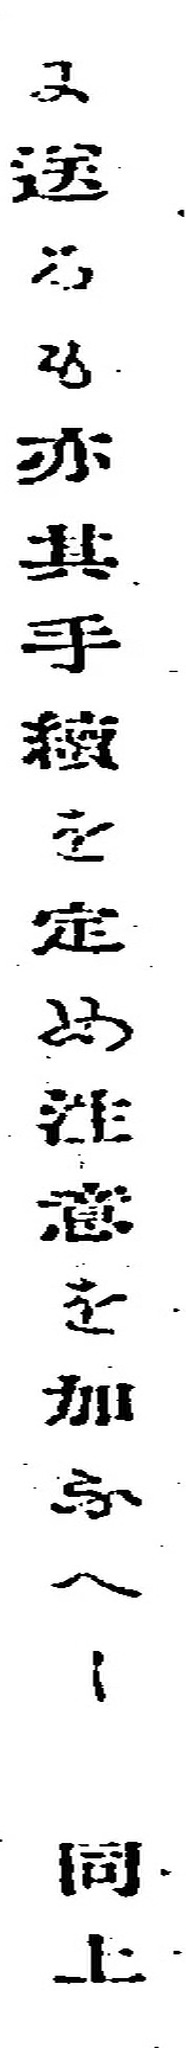に送るも亦其手続を定め注意を加ふへし同上
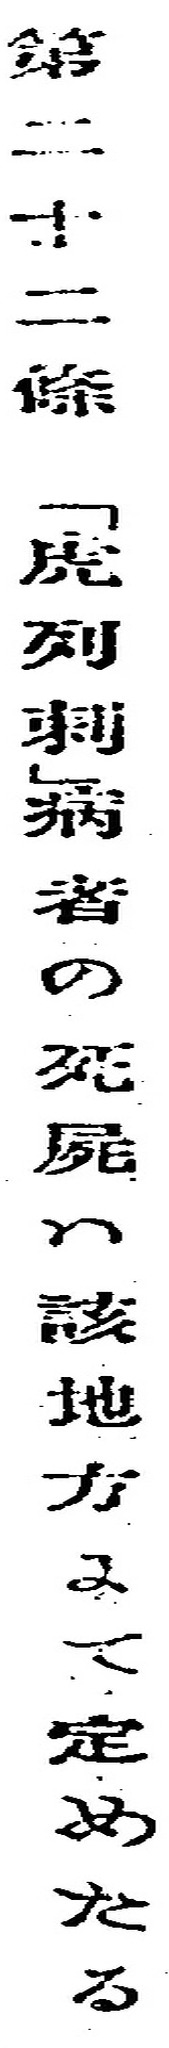第二十二条「虎列刺」病者の死屍は該地方にて定めたる
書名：これら病予防心得
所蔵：国立国会図書館 National Diet Library, JAPAN
